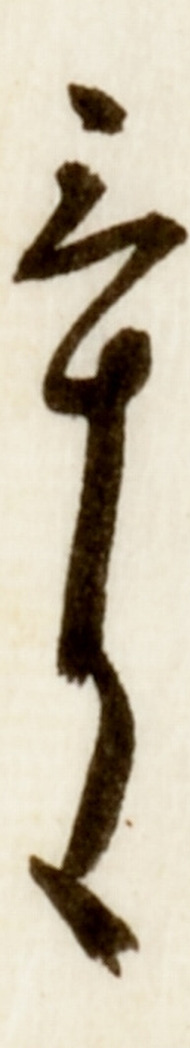三十文
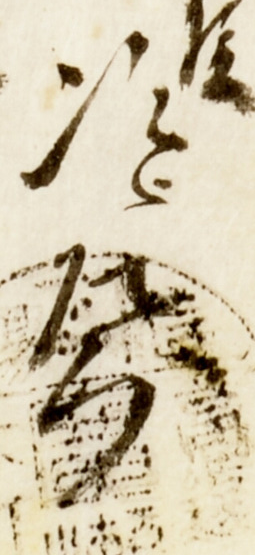次郎左衛門
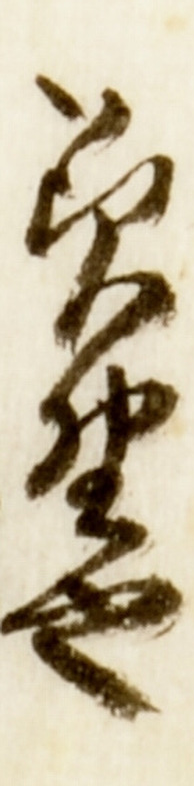美野や
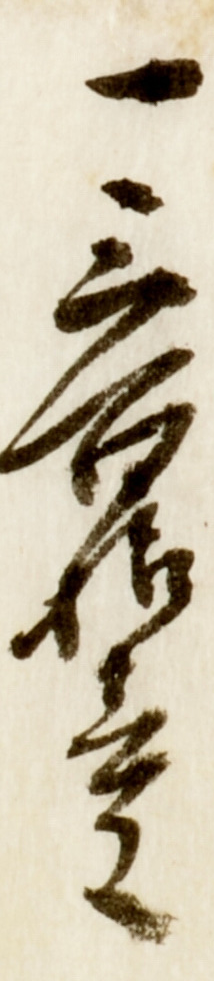一三百拾壱文

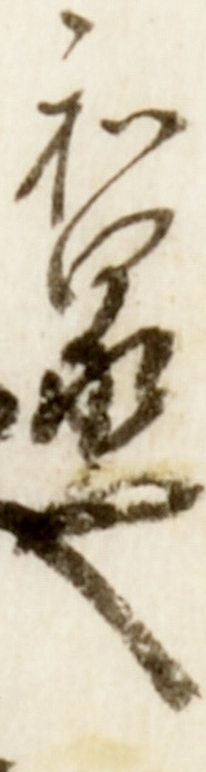和泉や
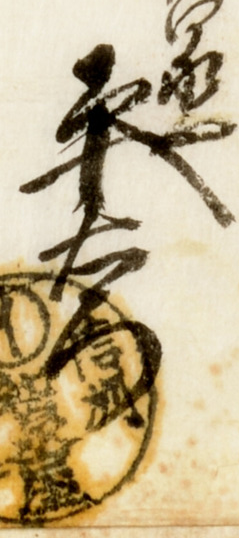平右衛門
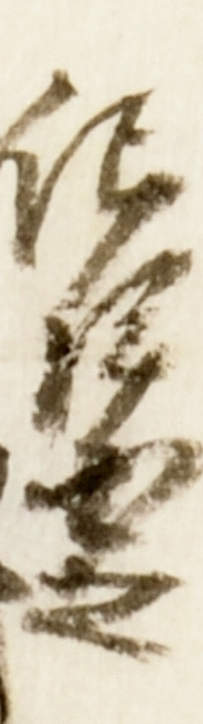紀伊国屋
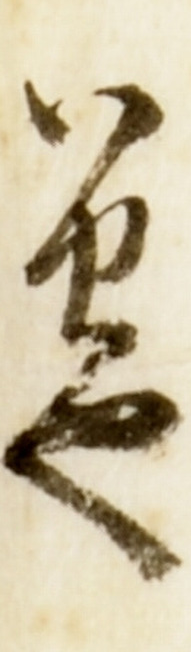いせや
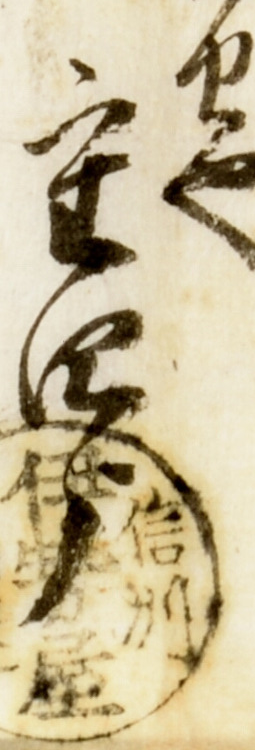重四郎
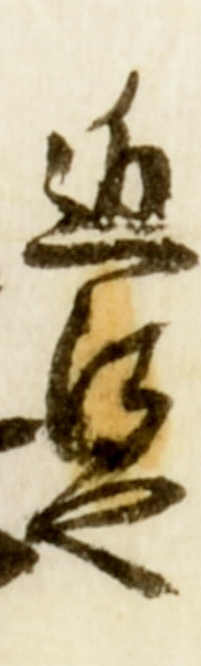近江や
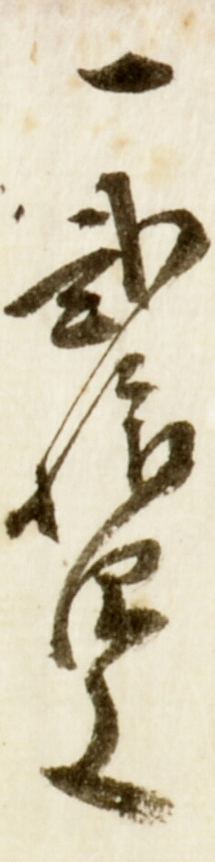一弐拾四文

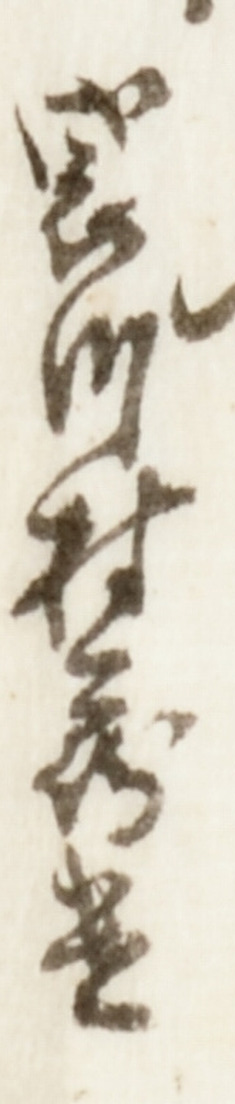袋町村蔵遣
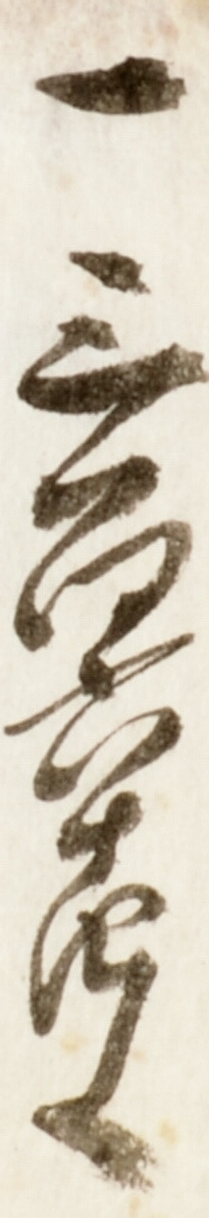一三百六拾四文
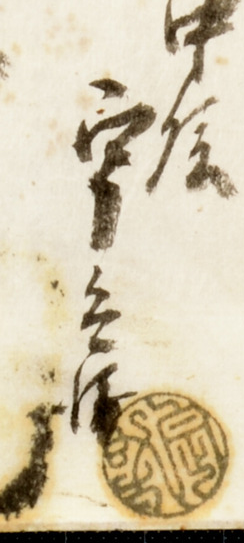宇兵衛
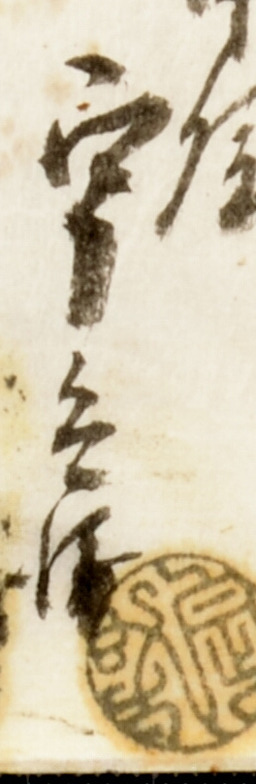宇兵衛
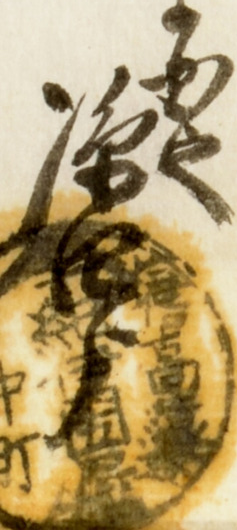源四郎
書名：御賄諸色控帳
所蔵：伊那市立高遠町図書館・合同会社AMANE
